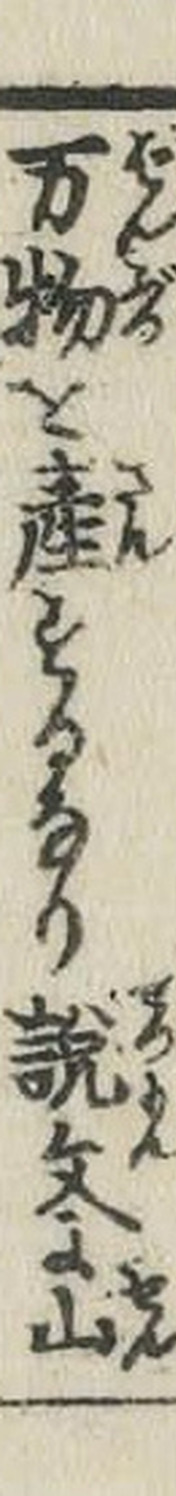万物を産するなり説文に山
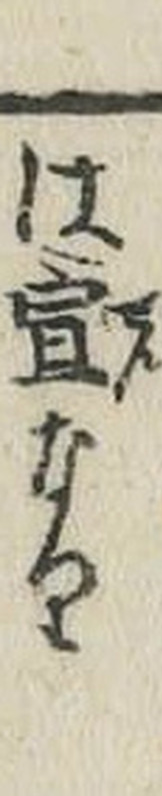は宣なり
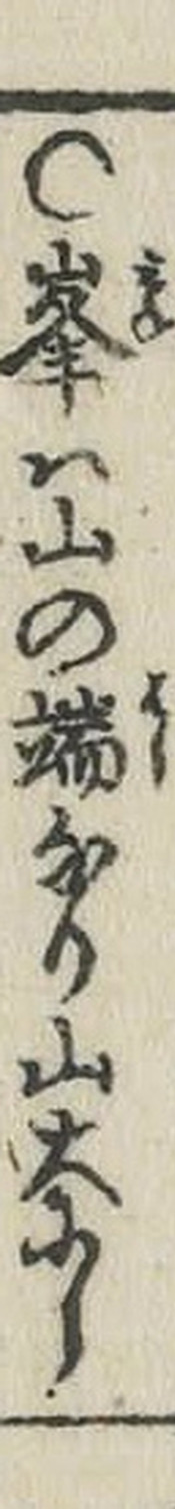○峯は山の端なり山大にし
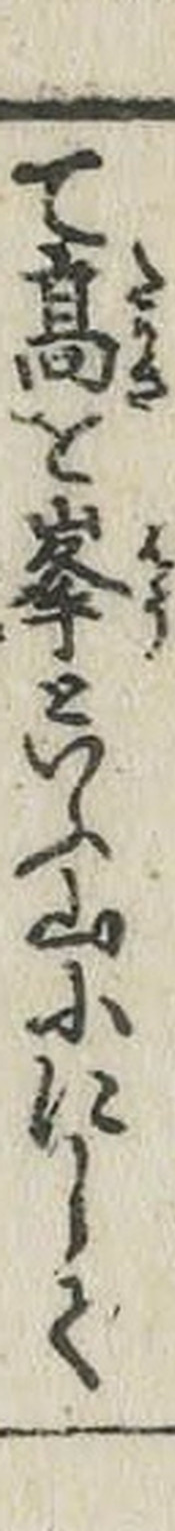て高を峯といふ山小にして
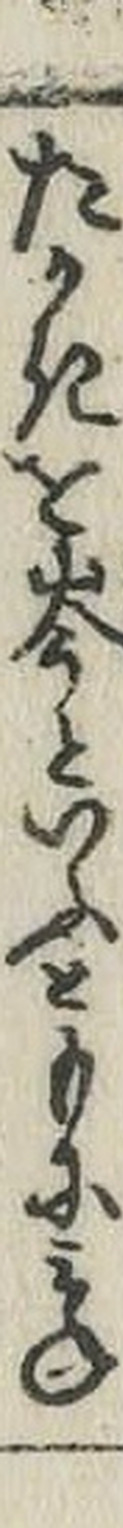たかきを岑といふともにみね
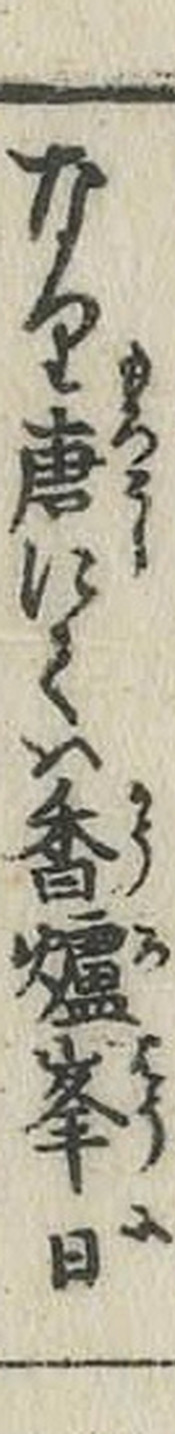なり唐にては香爐峯日
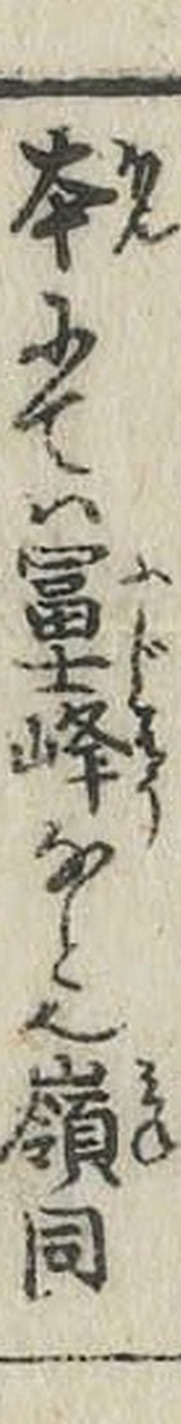本にては冨士峰なと也嶺同
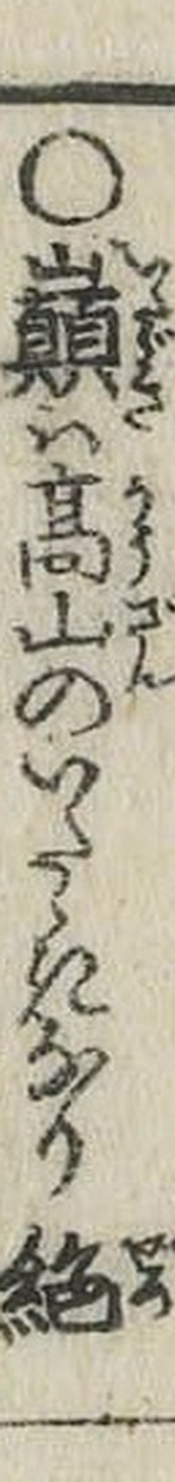○巓は高山のいたゝきなり絶
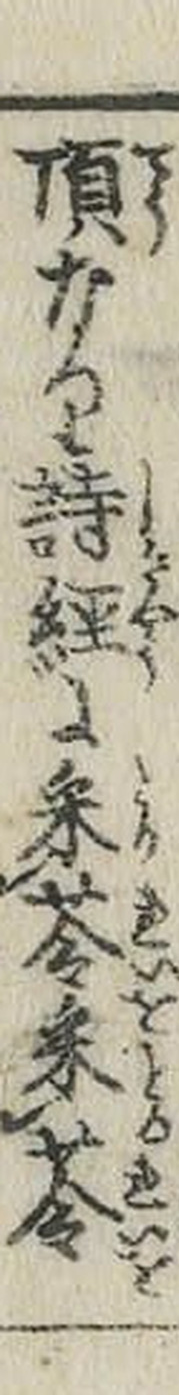頂なり詩経に采苓采苓
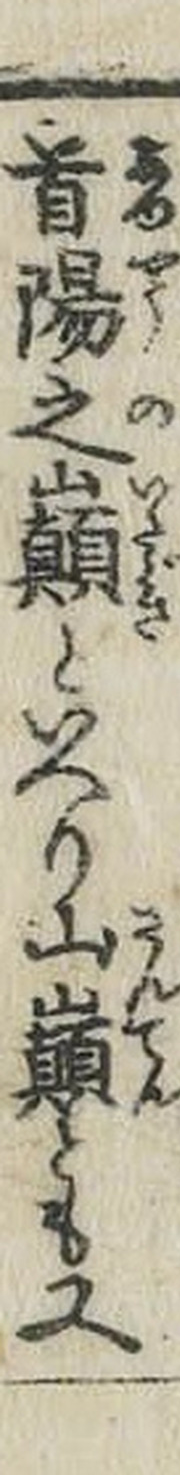首陽之巓といへり山巓とも又

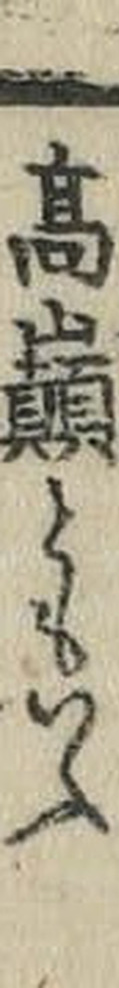高巓ともいふ
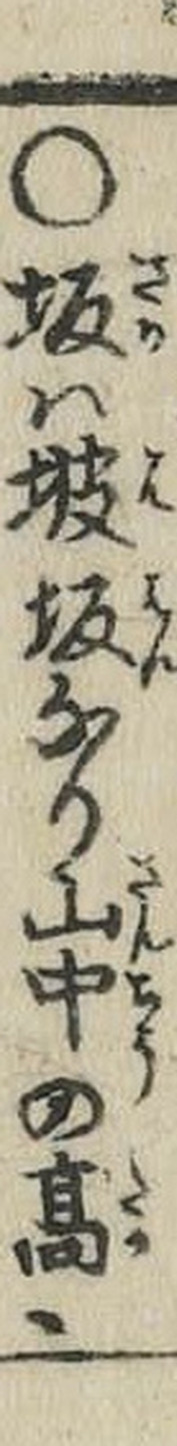○坂は坡坂なり山中の高
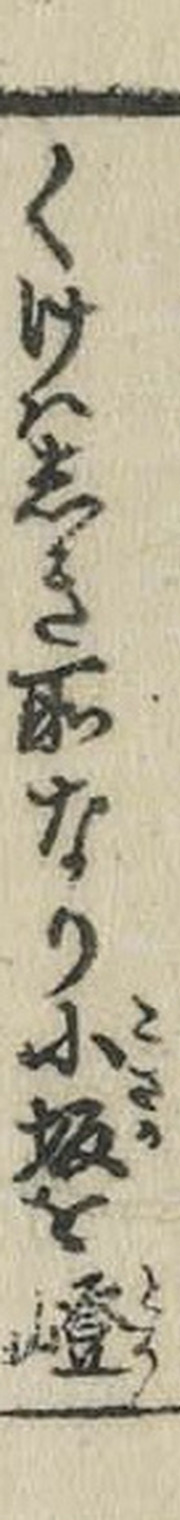くけはしき所なり小坂を嶝
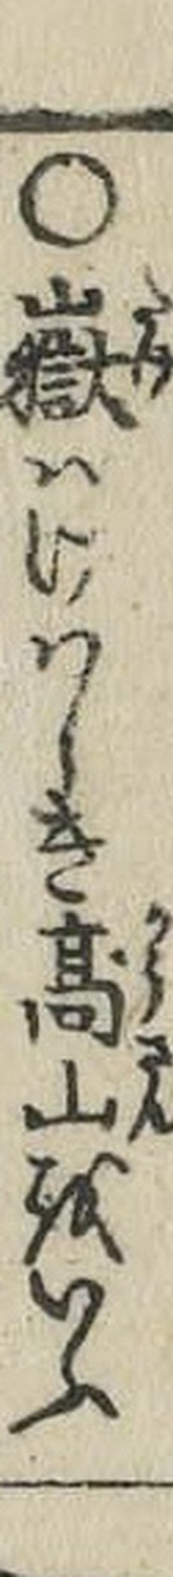○嶽はけはしき高山をいふ
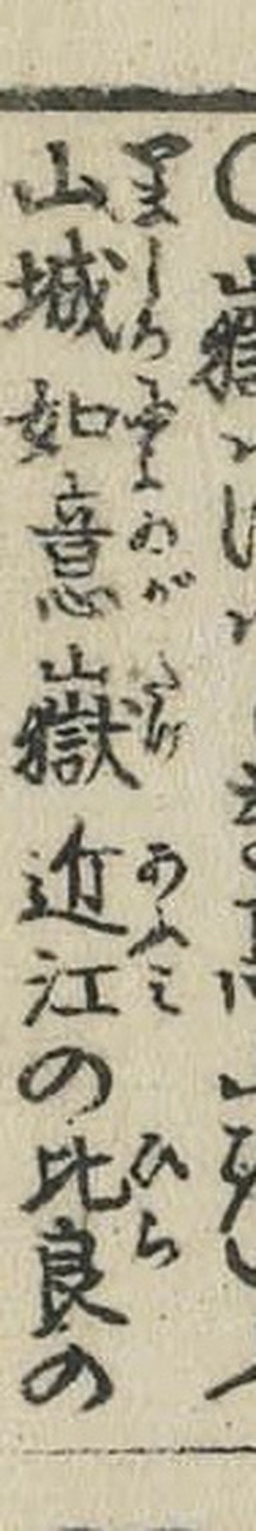山城如意嶽近江の比良の
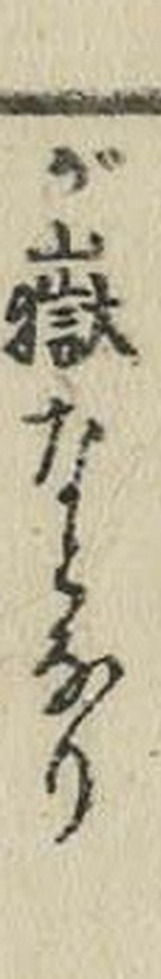が嶽なとなり
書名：増補頭書訓蒙図彙大成 10巻 2:巻之1-3
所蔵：東京学芸大学教育コンテンツアーカイブ
